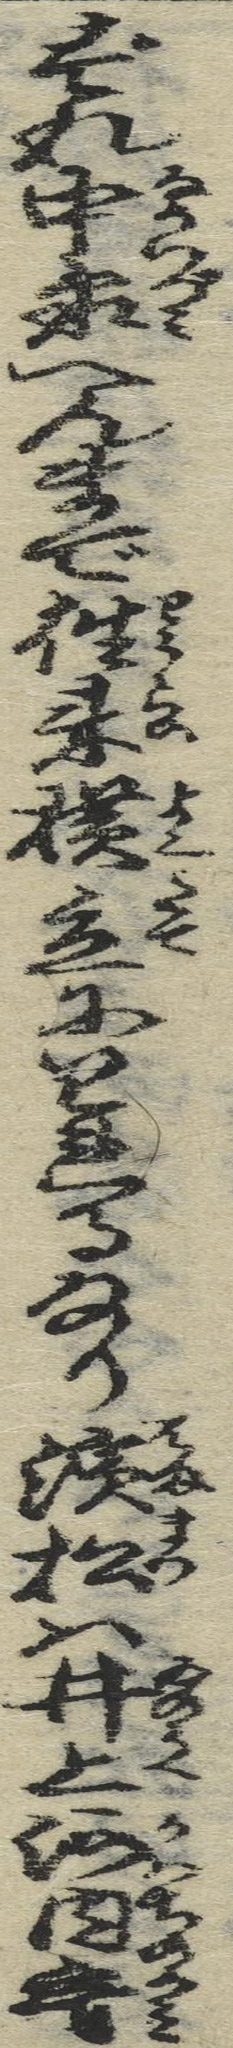ずれ中泉へんまで往来横立にわれるなり濱松は井上河内守
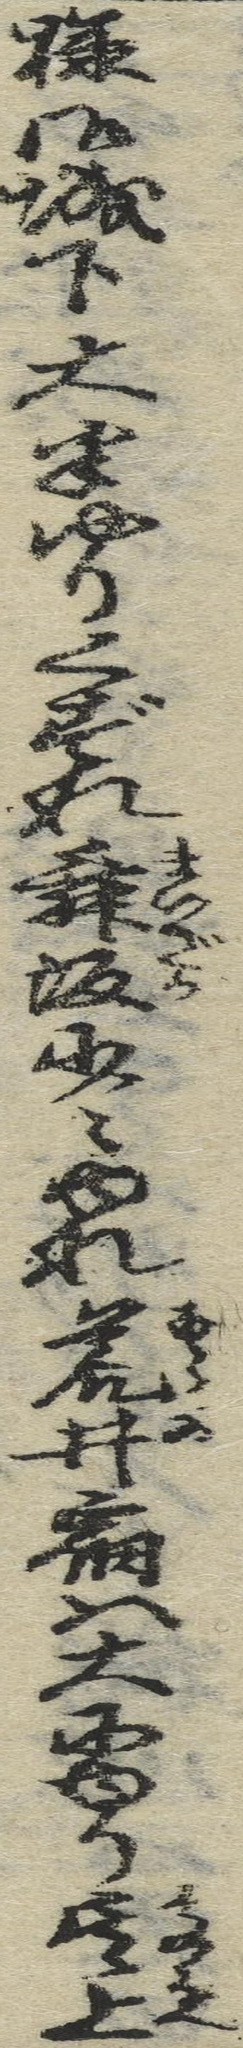様御城下大半ゆりくずれ舞阪少々ゆれ荒井宿は大にゆり其上
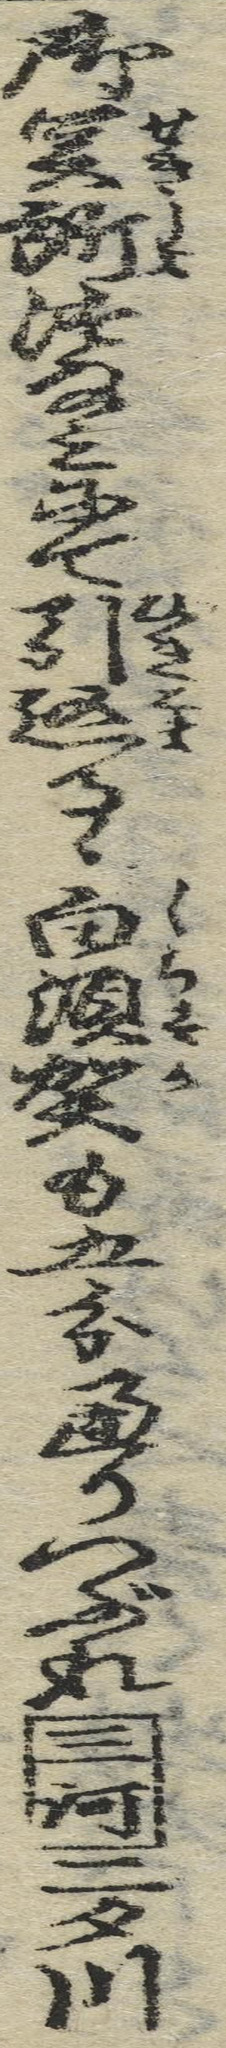御関所つなみにて引込るゝ白須賀も五分通りつぶれ三河二タ川
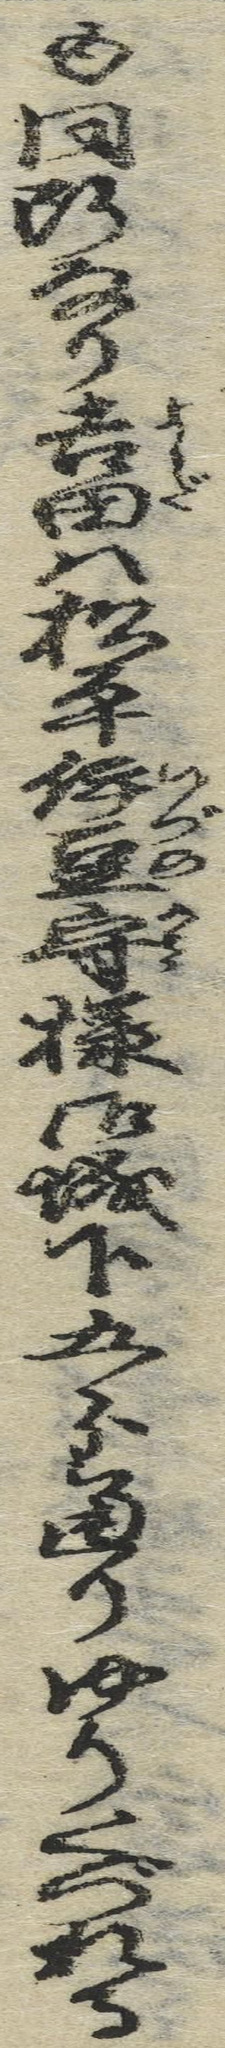も同断なり吉田は松平伊豆守様御城下五分通りゆりくづれる
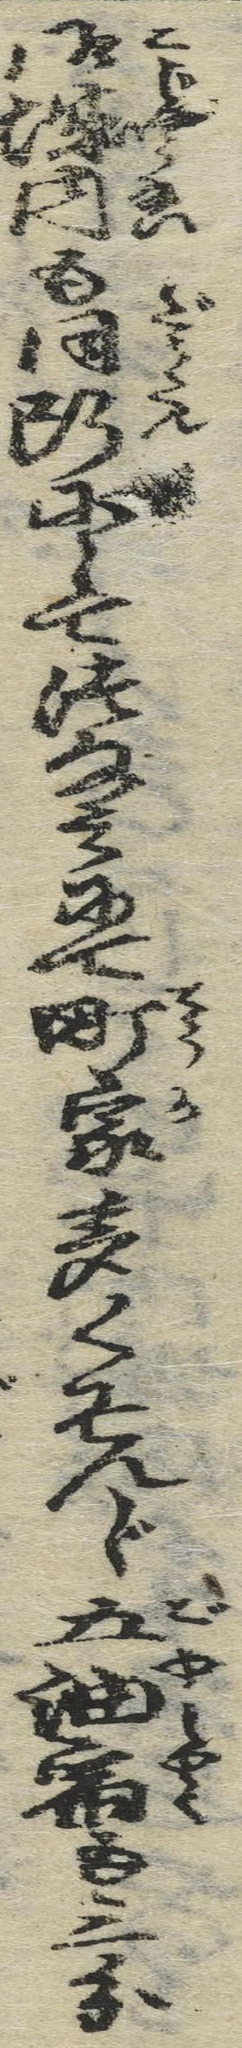御城内も同断にしてつなみにて町家多くそんじ五油宿も三分
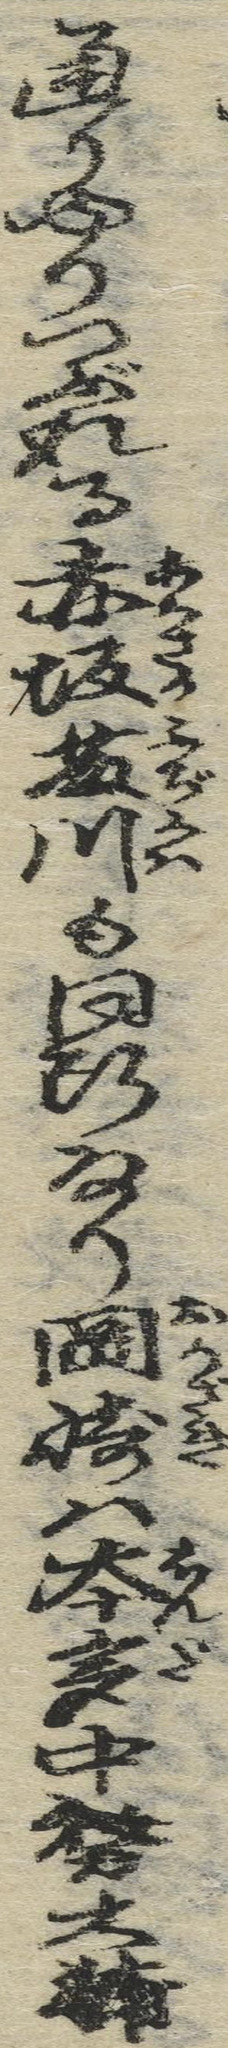通りゆりつぶれる赤坂藤川も同断なり岡崎は本多中務大輔
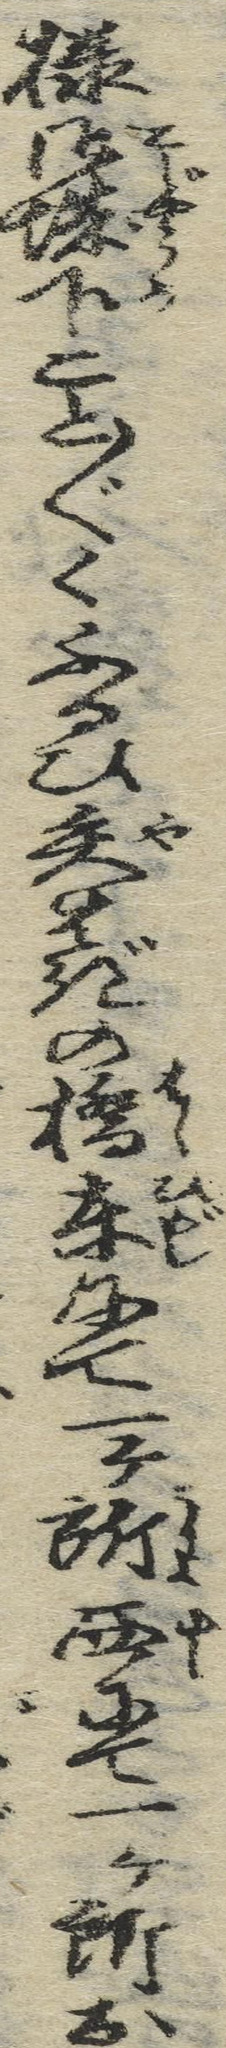様御城下こと〴〵くふるひ矢はぎの橋東にて一ヶ所西にて一ヶ所お
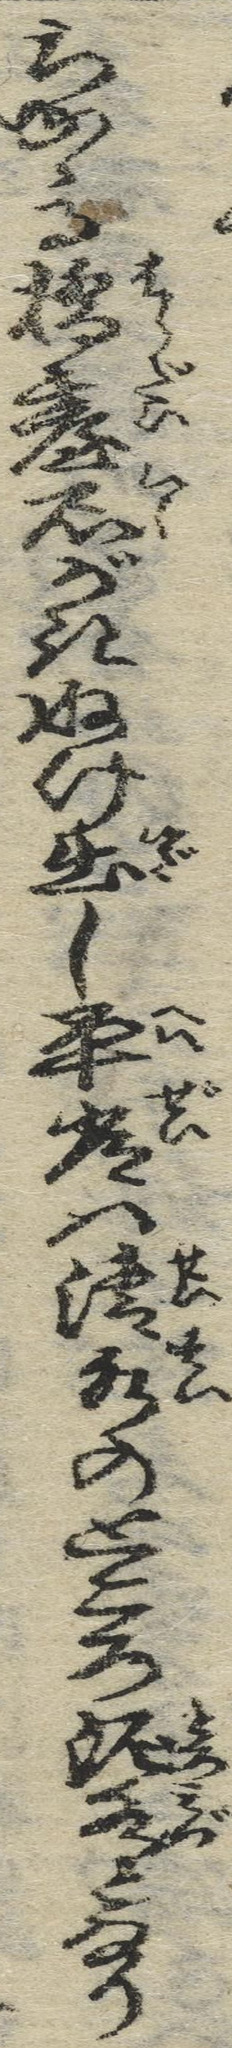ちかゝる橋台石がきぬけ出し平常は清水のところ泥水となり
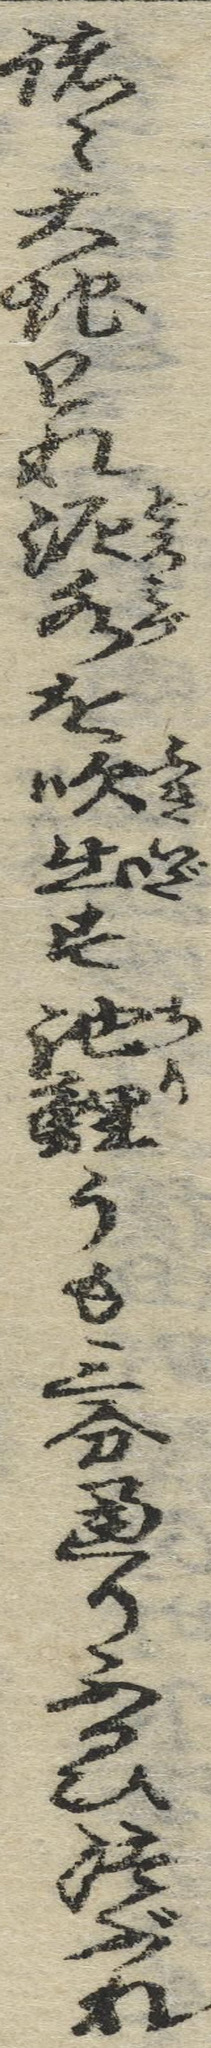諸々大地われ泥水を吹出す地鯉うも三分通りふるひつぶれ
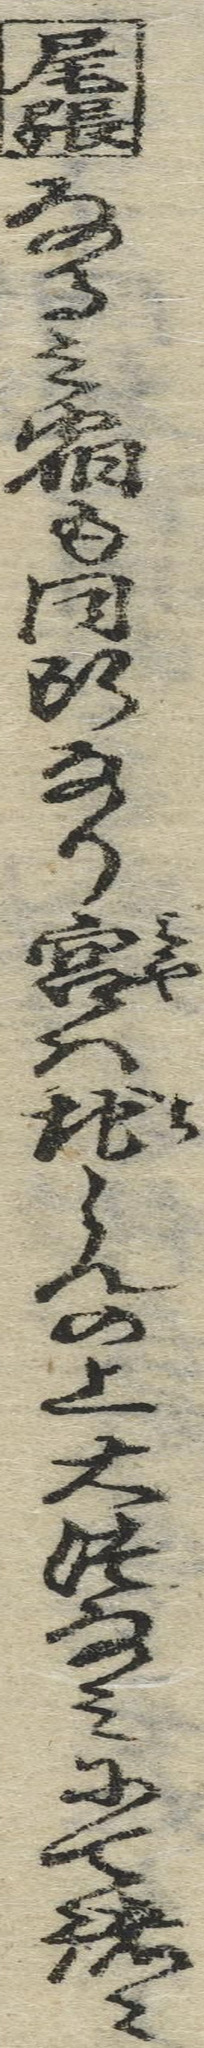尾張なるみ宿も同断なり宮は地しんの上大つなみにて諸々
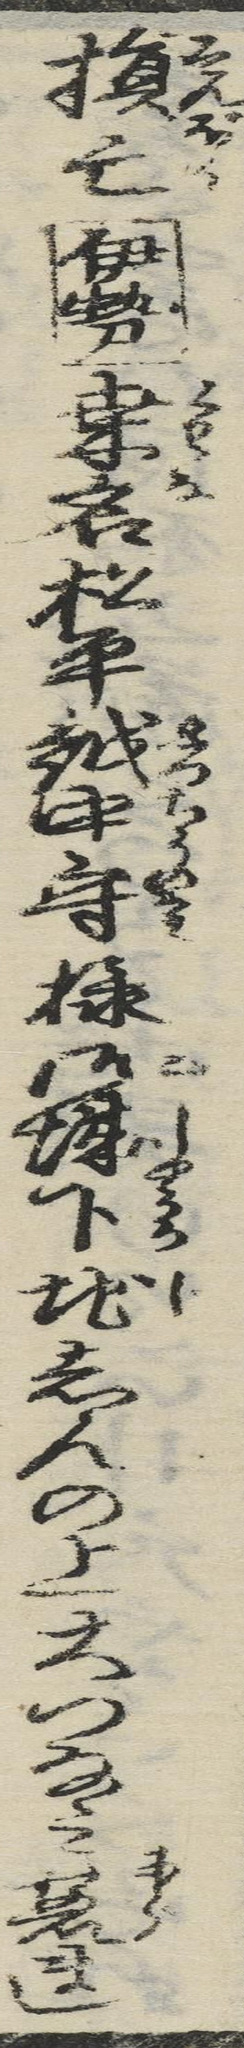損亡伊勢桑名松平越中守様御城下地しんの上大つなみ荒まし
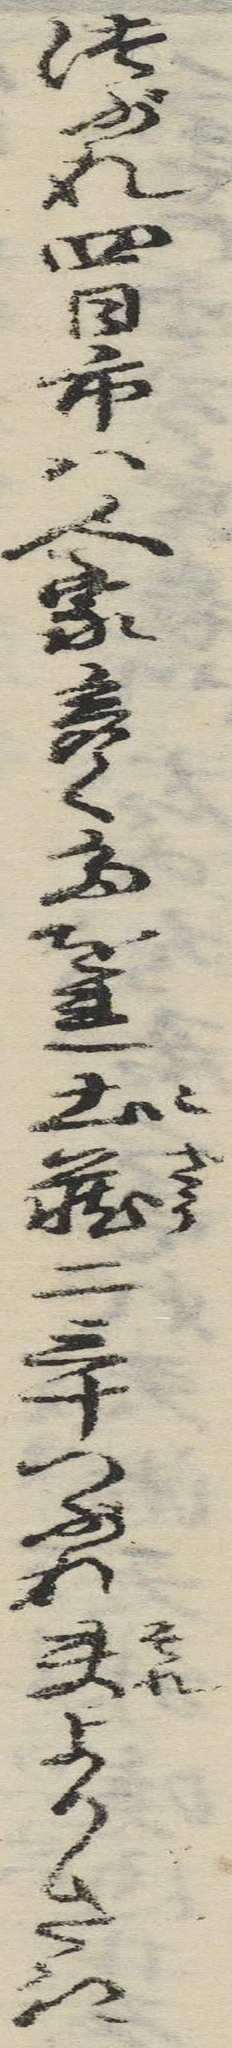つぶれ四日市は人家多くたをれ土蔵二三十つぶれ夫よりさき
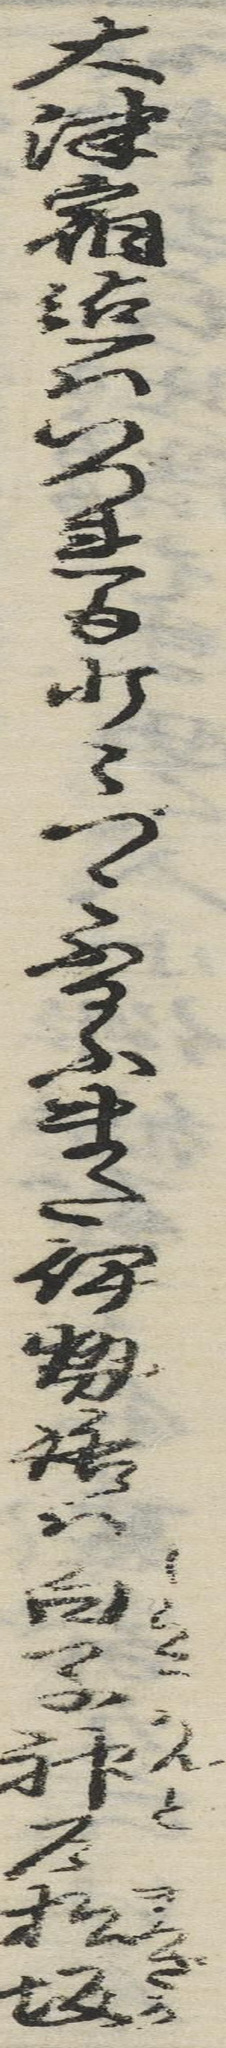大津宿迠はいつれも少々つゝふるふまた伊勢路は白子神戸松坂
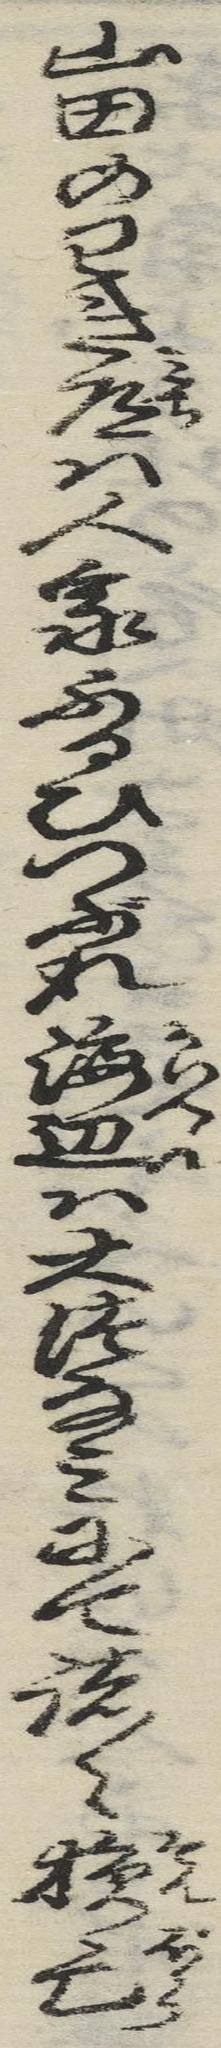山田のわき道は人家ふるひつぶれ海辺は大つなみにて諸々損亡
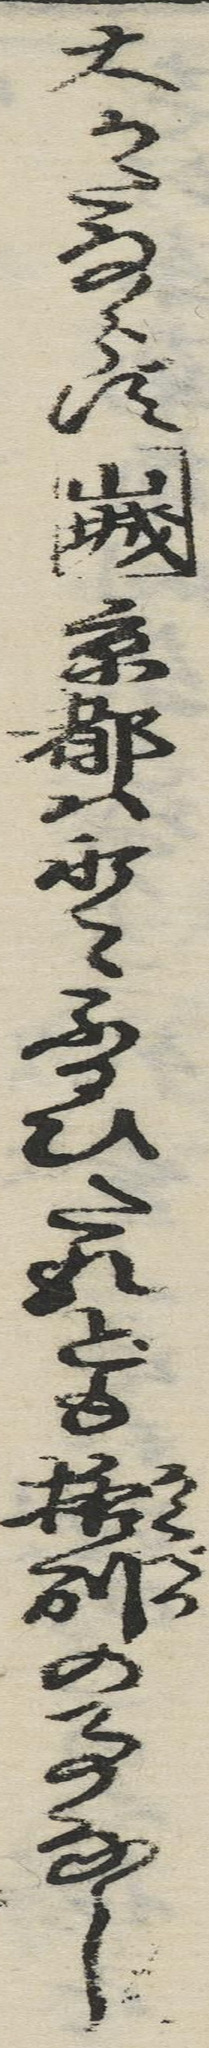大かたならず山城京都は少々ふるひたれども格別の事なし
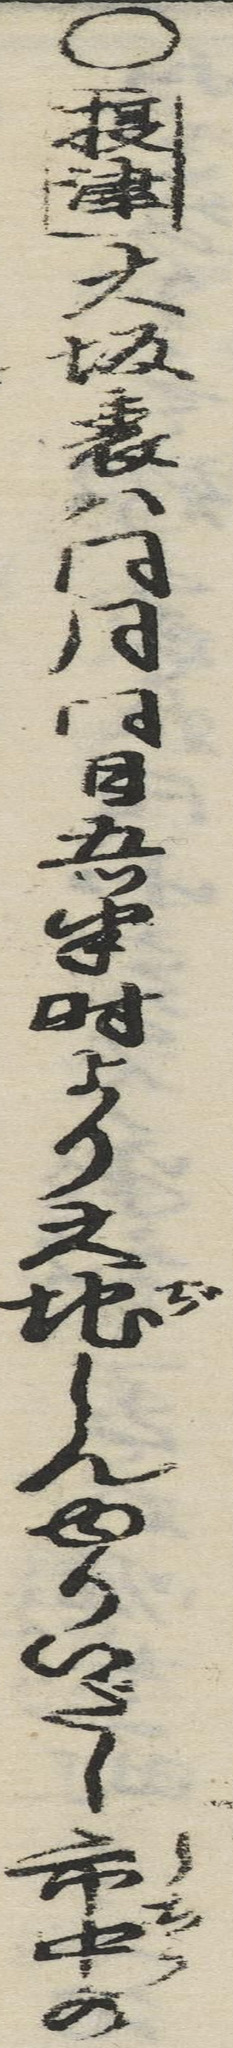○摂津大坂表は同月同日五ッ半時より大地しんゆりいだし市中の
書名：諸国海辺地震津波書
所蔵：東京大学地震研究所図書室 Earthquake Research Institute Library, The University of Tokyo, JAPAN
